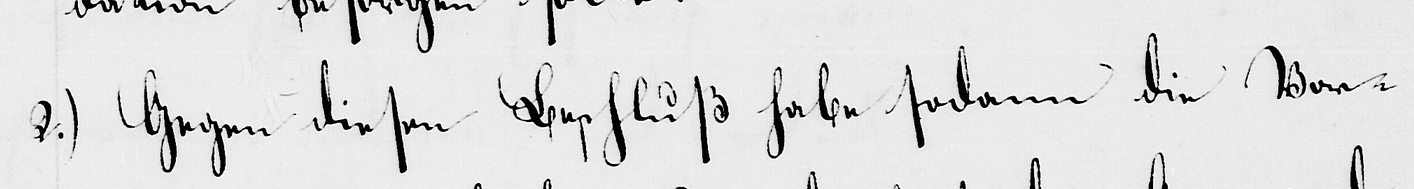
2.) Gegen diesen Beschluß habe sodann die Vor¬
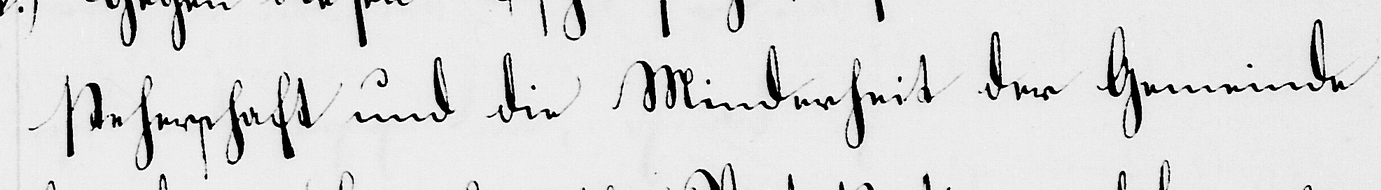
steherschaft und die Minderheit der Gemeinde
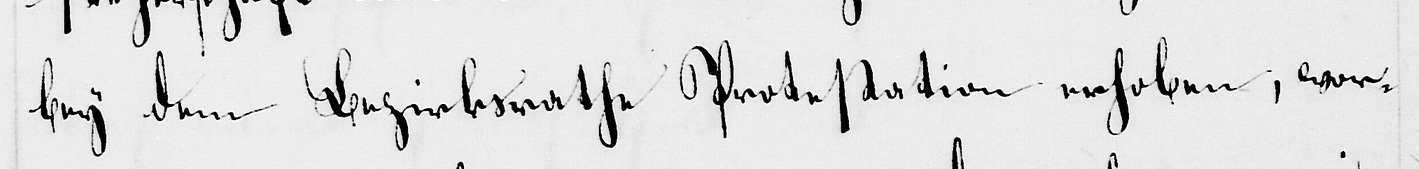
bey dem Bezirksrathe Protestation erhoben, wor¬
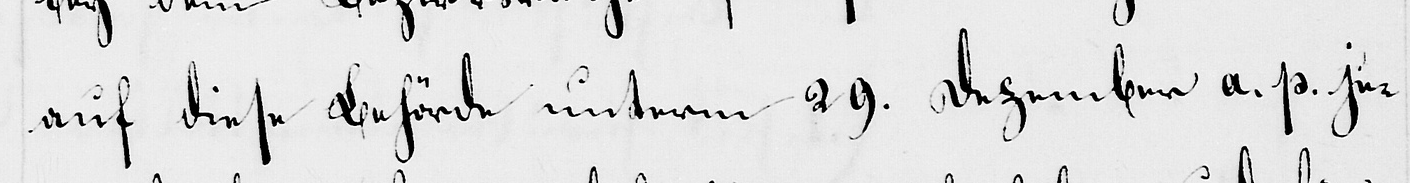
auf diese Behörde unterm 29. Dezember a. p. je¬
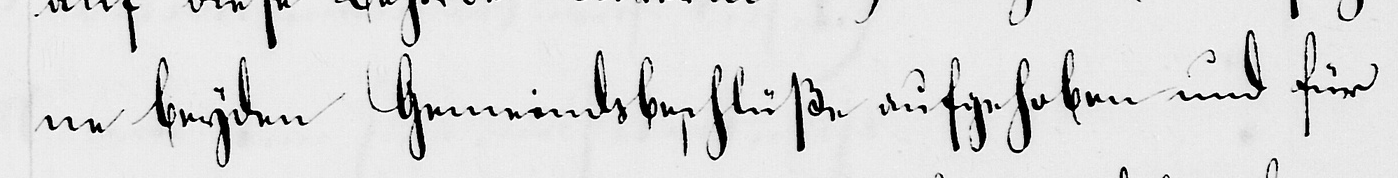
ne beyden Gemeindsbeschlüße aufgehoben und für
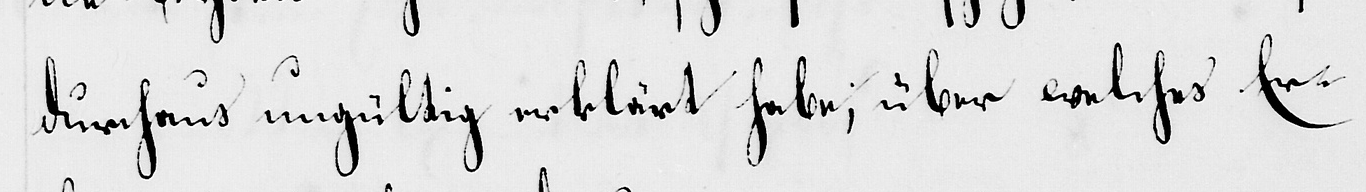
durchaus ungültig erklärt habe; über welches Er¬
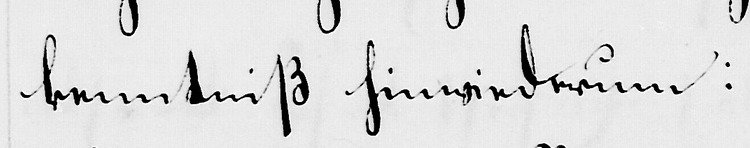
kenntniß hinwiederum:
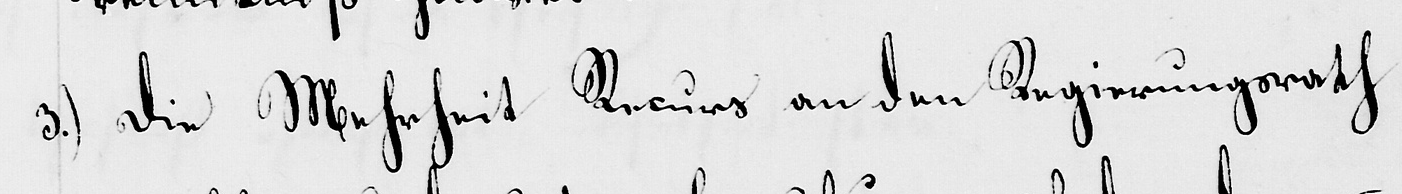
3.) Die Mehrheit Recurs an den Regierungsrath
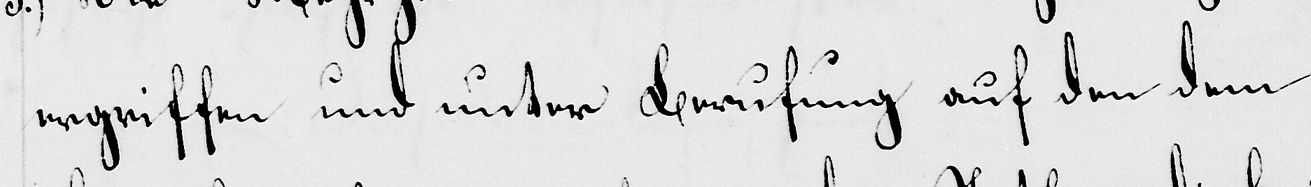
ergriffen und unter Berufung auf den dem
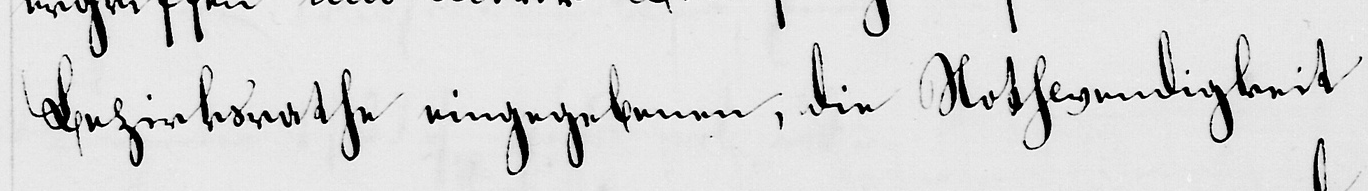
Bezirksrathe eingegebenen, die Nothwendigkeit
